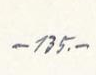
135
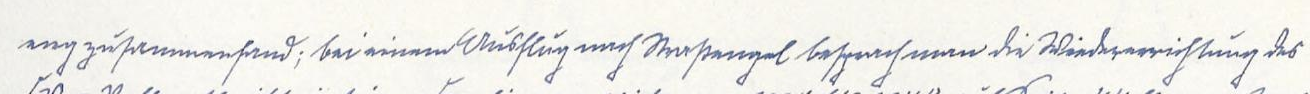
eng zusammenfand; bei einem Ausflug nach Straßengel besprach man die Wiedererrichtung des
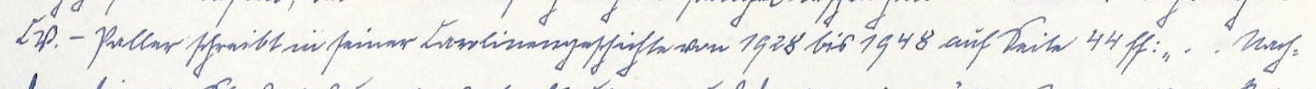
CV. - Paller schreibt in seiner Carolinengeschichte von 1928 bis 1948 auf Seite 44 ff.: "...Nach
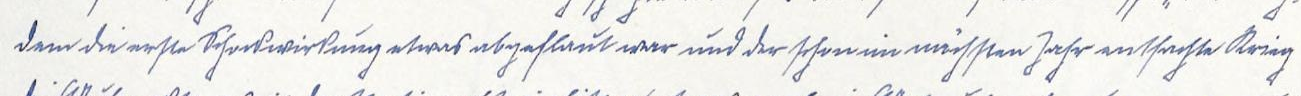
dem die erste Schockwirkung etwas abgeflaut war und der schon im nächsten Jahr entfachte Krieg
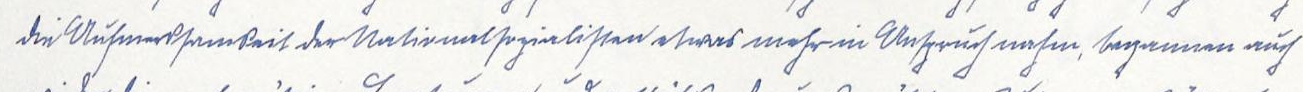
die Aufmerksamkeit der Nationalsozialisten etwas mehr inAnspruch nahm, begannen auch
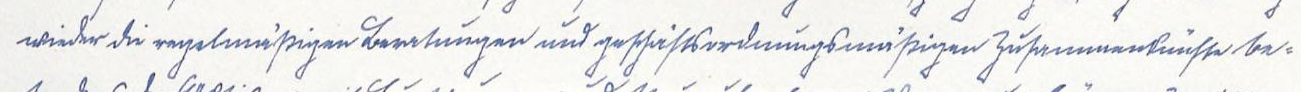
wieder die regelmäßigen Beratungen und geschäftsordnungsmäßigen Zusammenkünfte be-
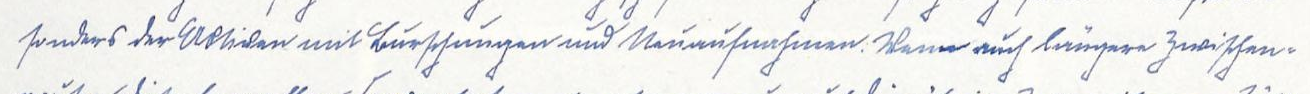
sonders der Aktiven mit Burschungen und Neuaufnahmen. Wenn auch längere Zwischen-
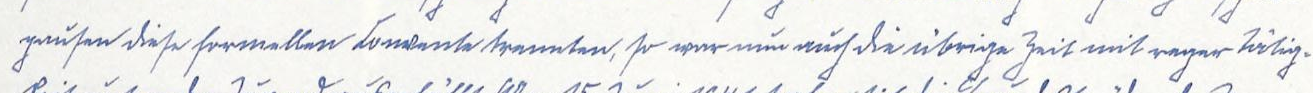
Pausen diese formellen Convente trennten, so war nun auch die übrige Zeit mit reger Tätig-
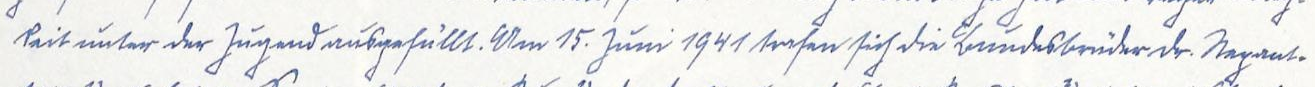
keit unter der Jugend ausgefüllt. Am 15. Juni 1941 trafen sich die Bundesbrüder Dr. Stepant-
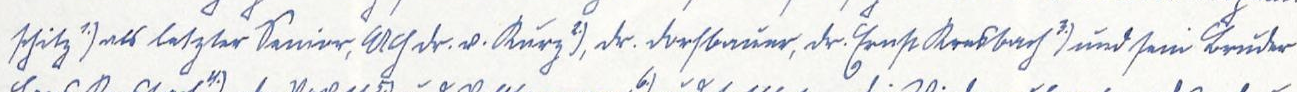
schitz 1) als letzter Senior, Dr. v. Kurz.2), Dr. Dorfbauer, Dr. Ernst Kresbach )und sein Bruder
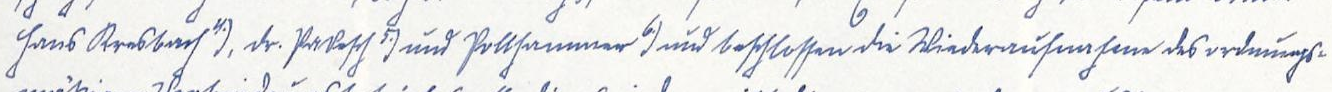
Hans Kresbach 4), Dr. Pakesch 5) und Polhamner 6) und beschlossen die Wiederaufnahme des ordungs-
